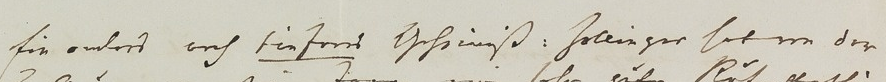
Ein anders noch tieferes Geheimniß: Zollinger hat von der
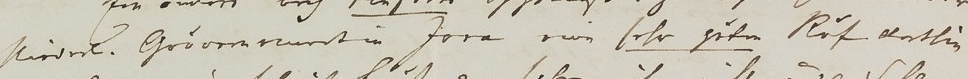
Niederl. Gouvernement in Iran einen sehr guten Ruf dorthin
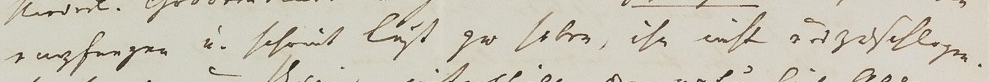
empfangen u. scheint Lust zu haben, ihn nicht auszuschlagen.
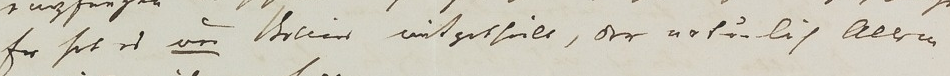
Er hat es nurBollier mitgetheilt, der natürlich Allem
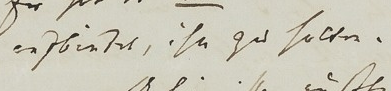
aufbietet, ihn zu halten.
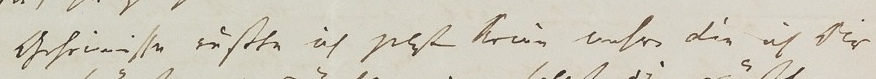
Geheimisse wüsste ich jetzt Keine mehr, die ich Dir
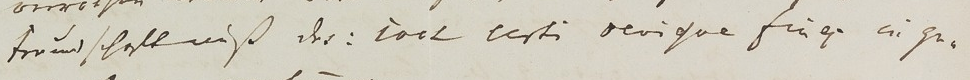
Freundschaft muß das: sunt certi denique fines in ge-
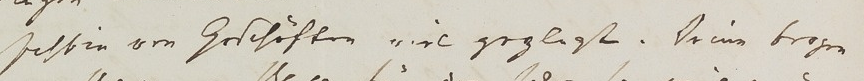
Ich bin von Geschäften viel geplagt. Deine tragen
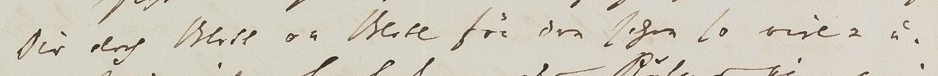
Dir doch Blatt an Blatt für den schon so viel- u.
